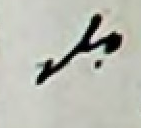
Do
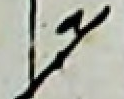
7
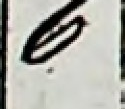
6
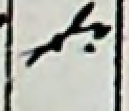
Do
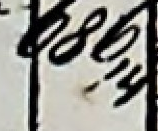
686,4
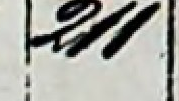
211
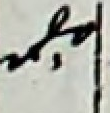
Do
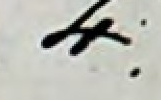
4
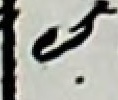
5
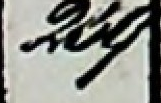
259
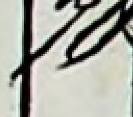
70
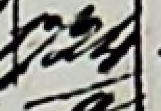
1724/a
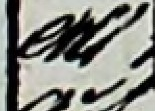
Alt
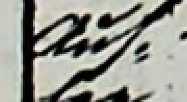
Aus„
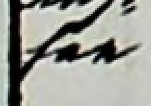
see
